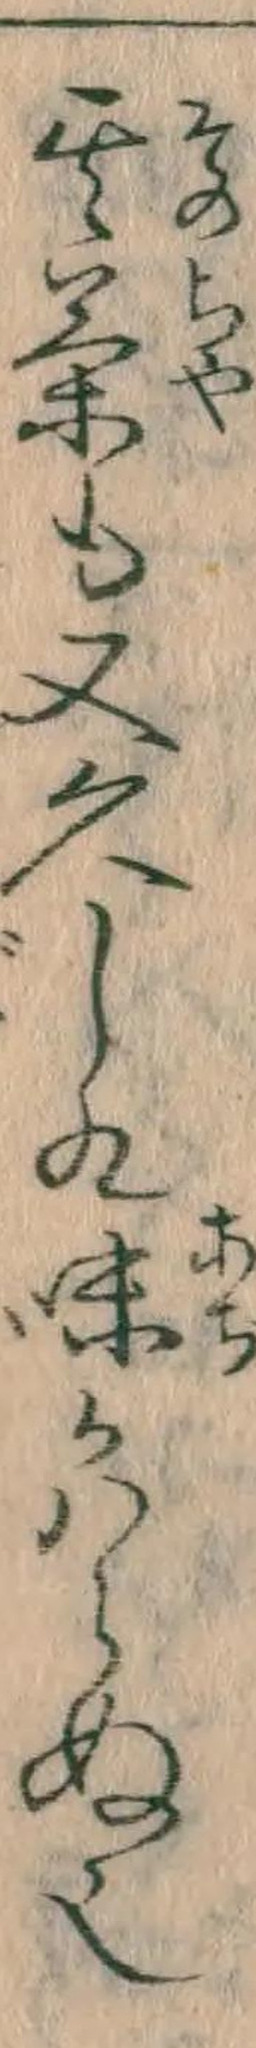其茶も又久しく味かはらぬ也
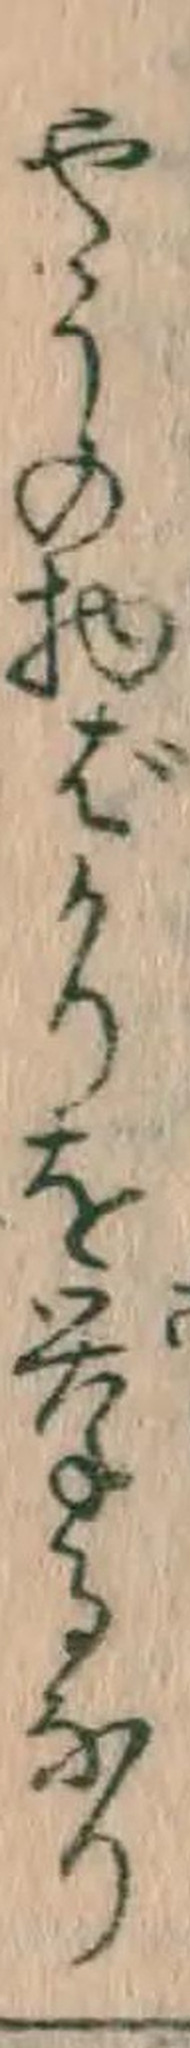やうの物ばかりを挙るなり
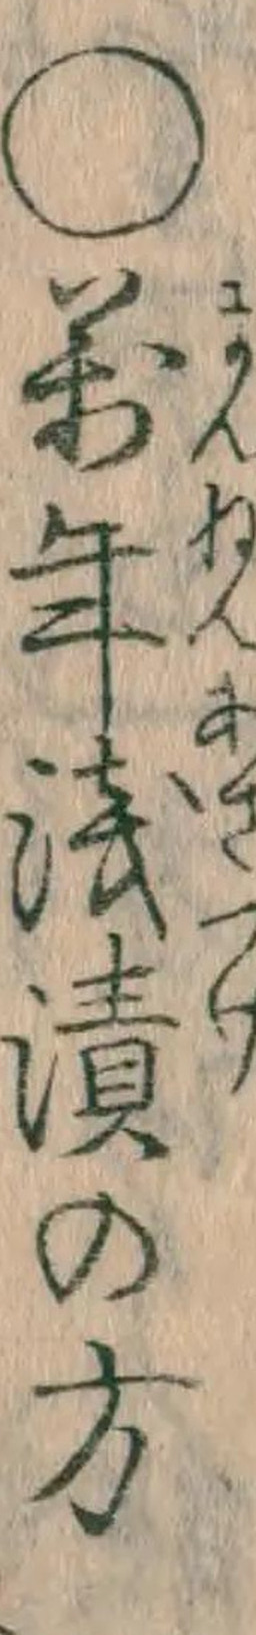○万年浅漬の方
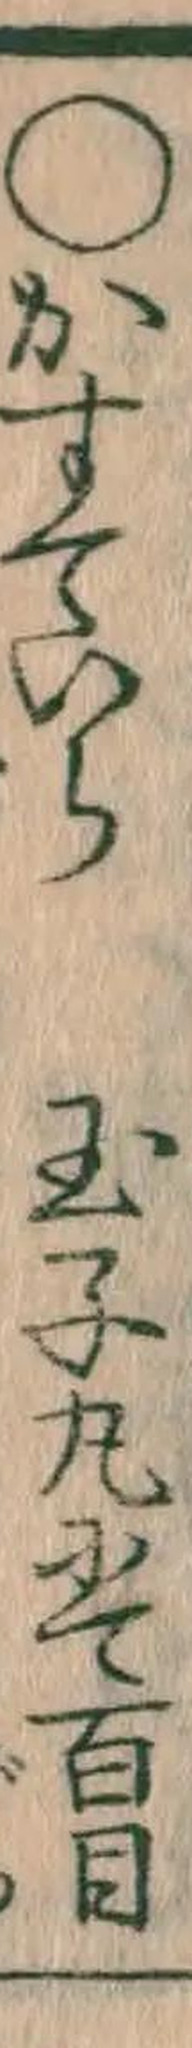○かすていら玉子丸にて百目
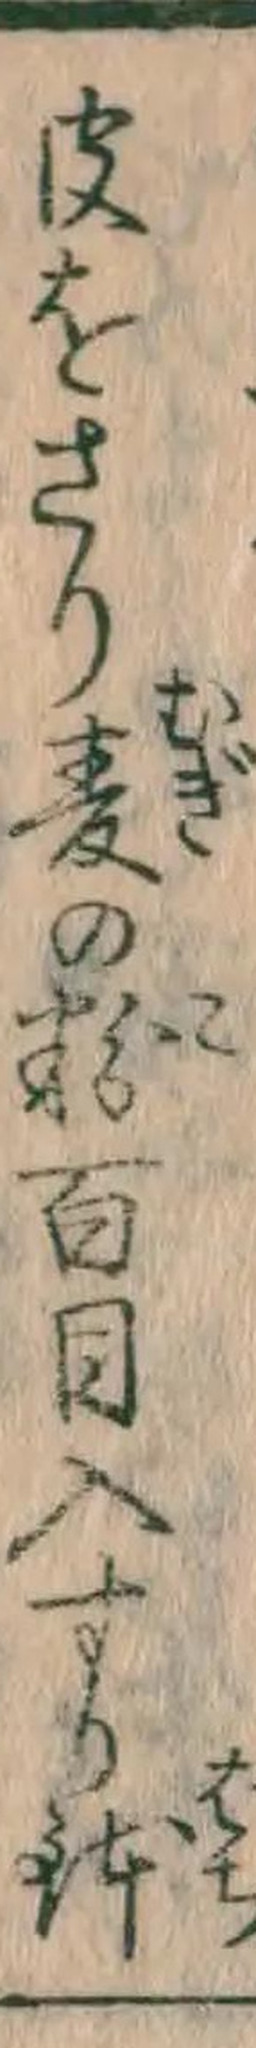皮をさり麦の粉百目入すり鉢
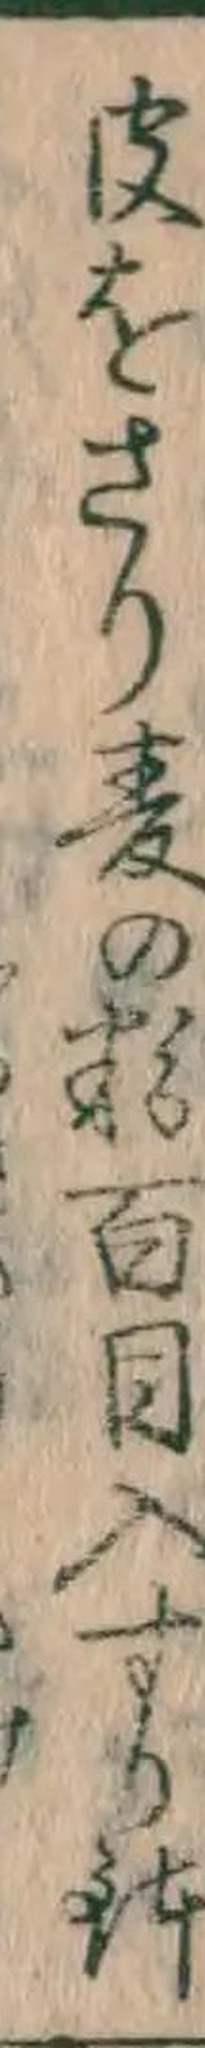皮をさり麦の粉百目入すり鉢
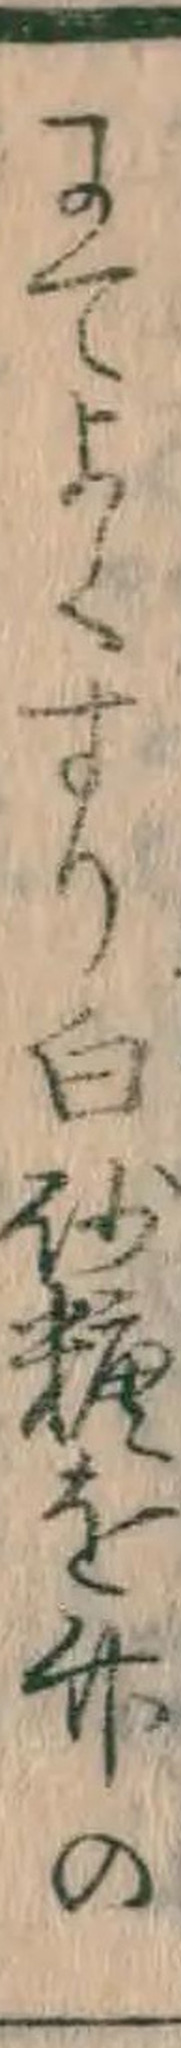にてよくすり白砂糖を竹の
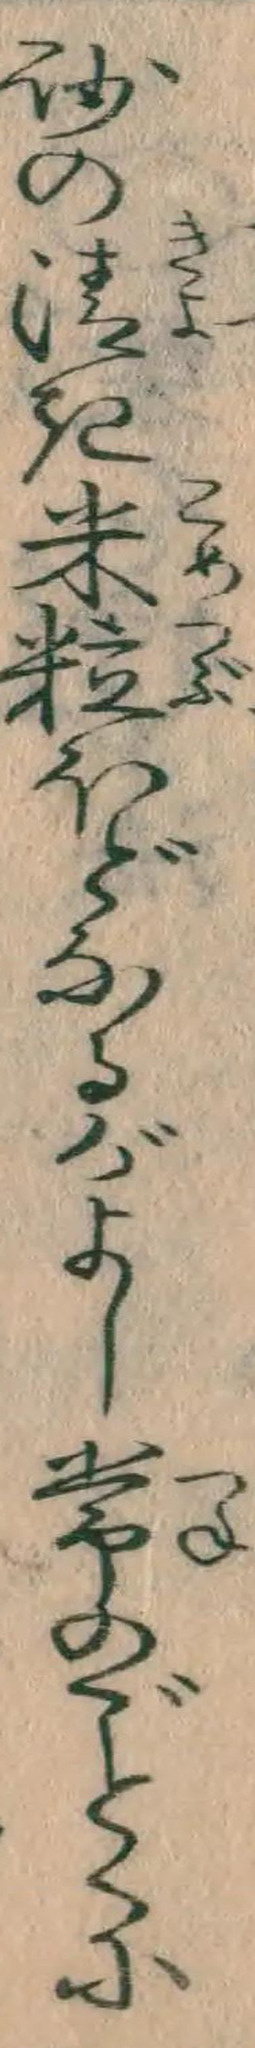砂の清き米粒ほどなるがよし常のごとくに
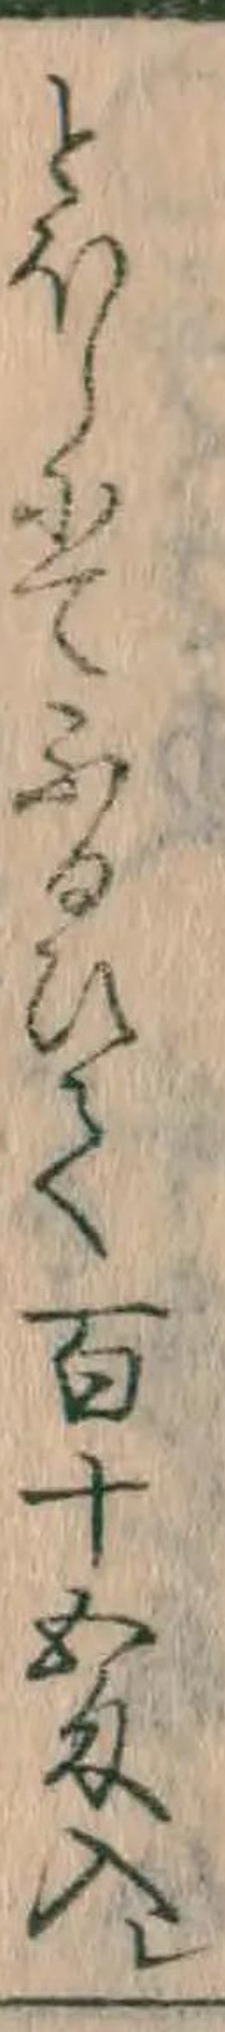とほしにてふるひて百十五匁入れ
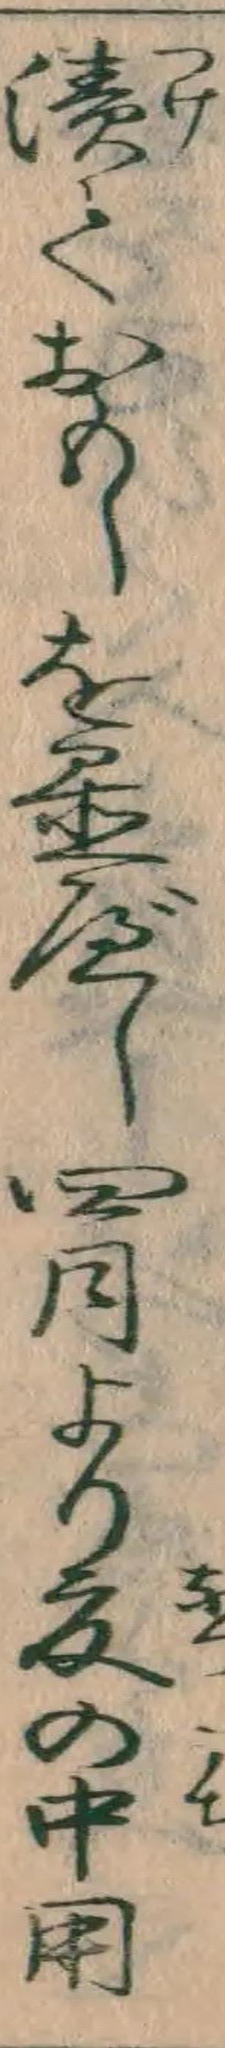漬ておもしを置べし四月より夏の中用
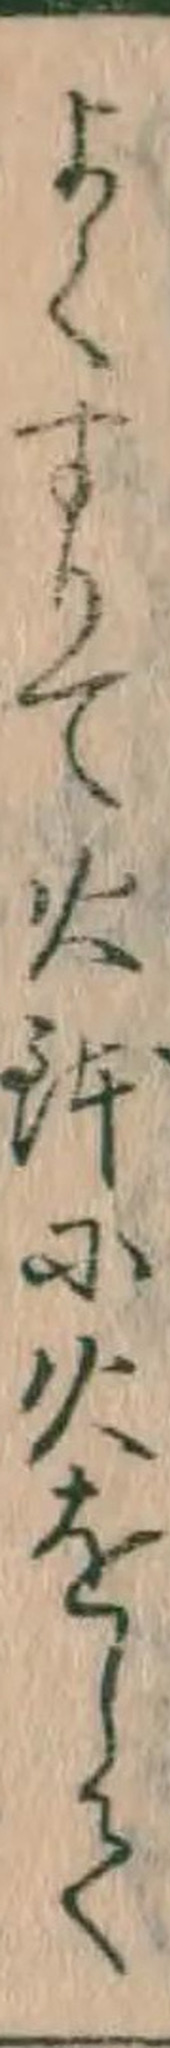よくすりて火鉢に火をして
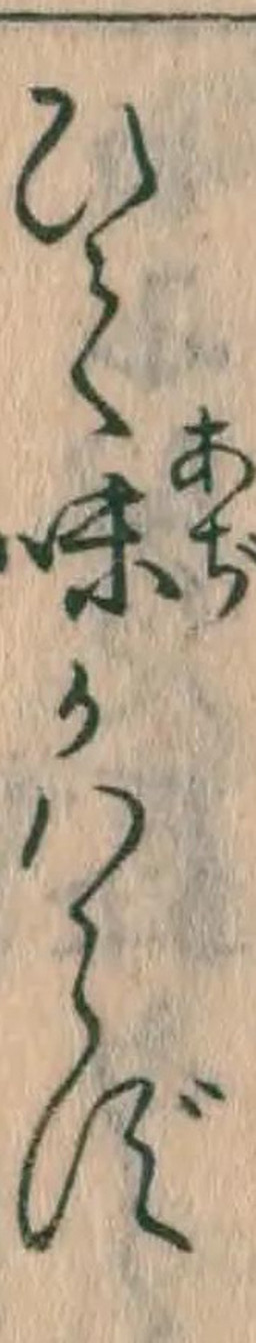ひて味かはらず
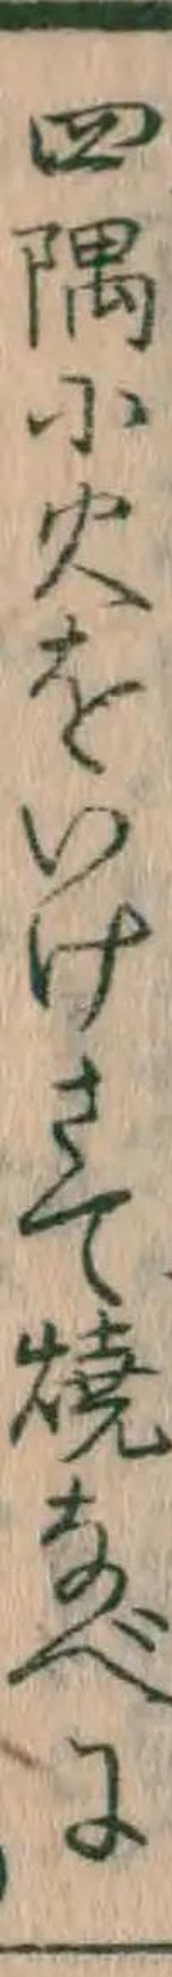四隅に火をいけさて焼なべに
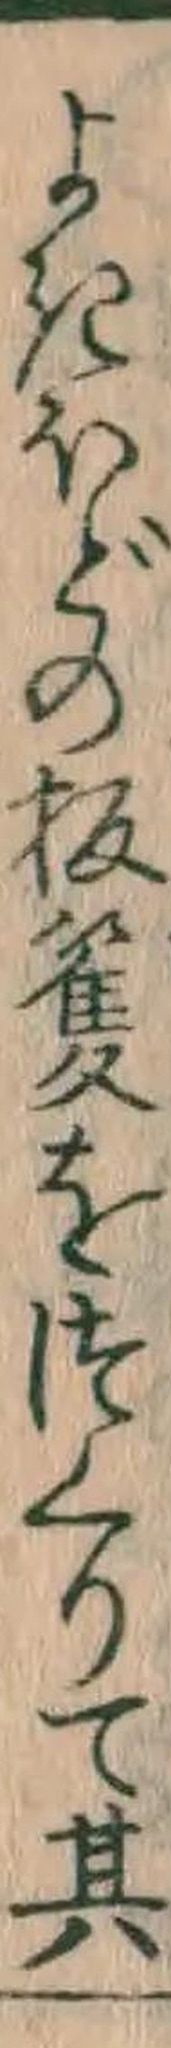よきほどの板篗をつくりて其
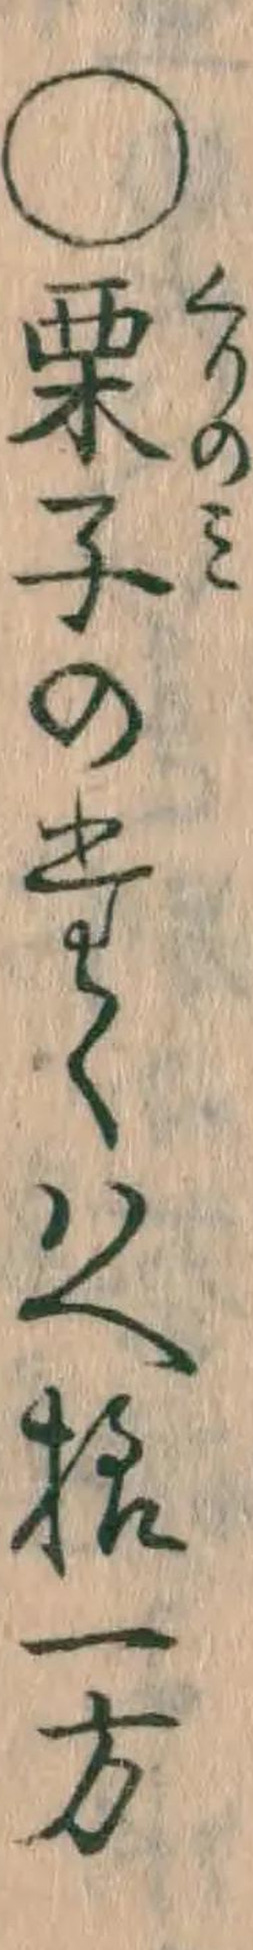○栗子のたくはへ様一方
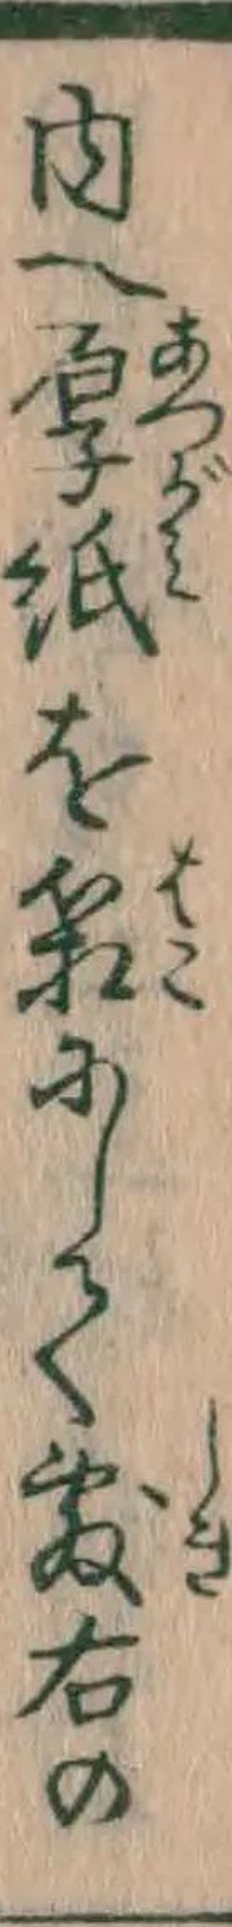内へ厚紙を箱にして敷右の
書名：広益秘事大全 3巻. [5]
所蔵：国立国会図書館 National Diet Library, JAPAN
